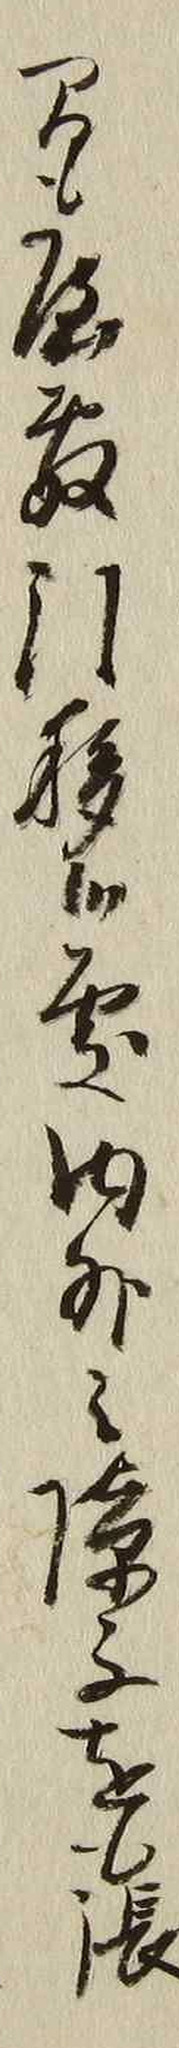間も屋敷引移候処内外之障子をも張
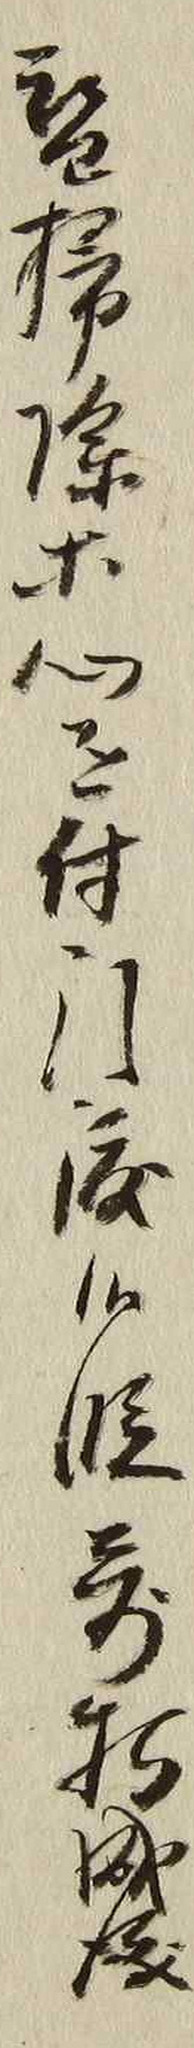替掃除等心を付引渡候段奇特成儀
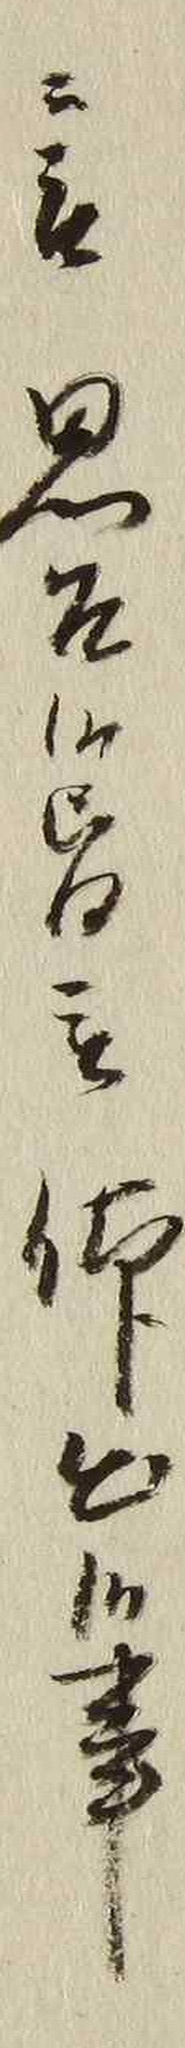ニ被思召候旨被仰出候事
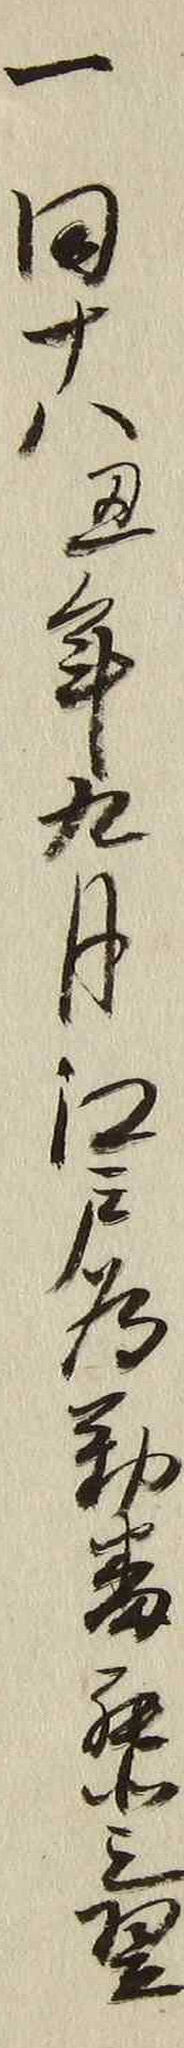一同十八丑年九月江戸為勤番罷登翌
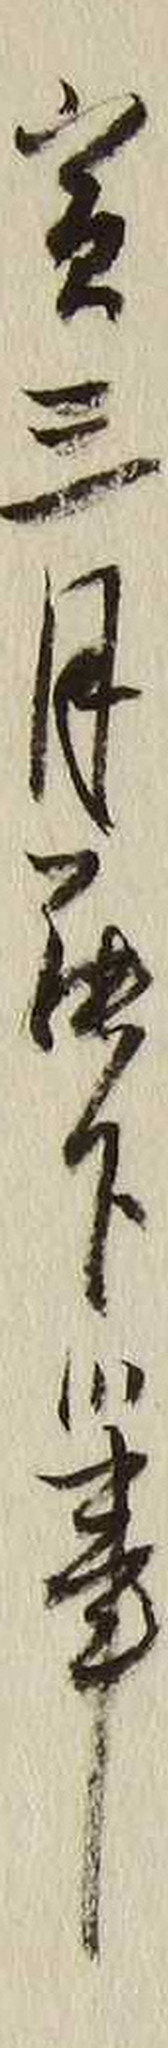寅三月罷下候事
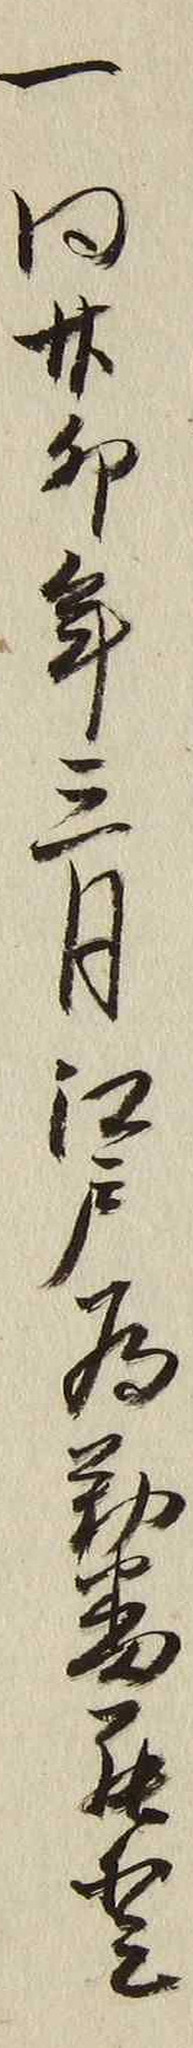一同廿卯年三月江戸為勤番罷登
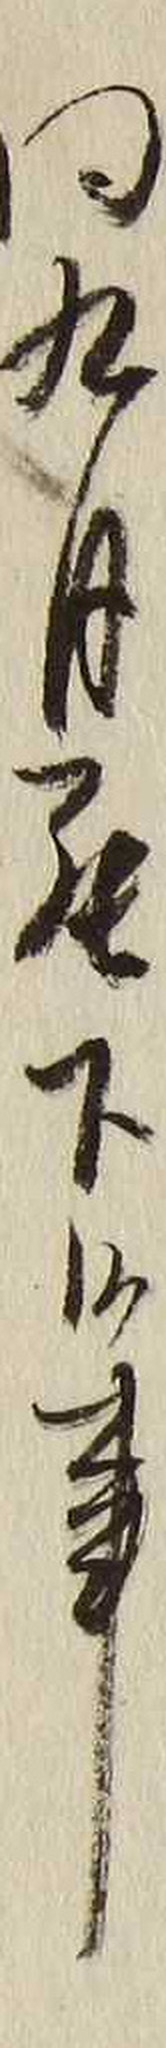同九月罷下候事
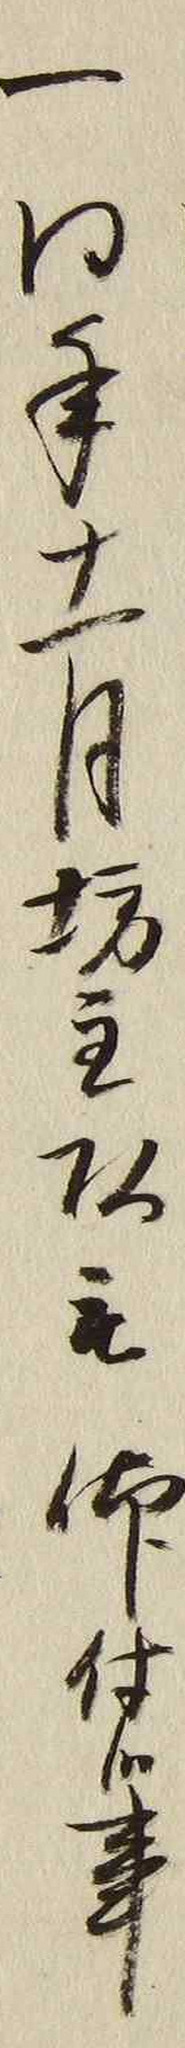一同年十一月坊主頭被仰付候事
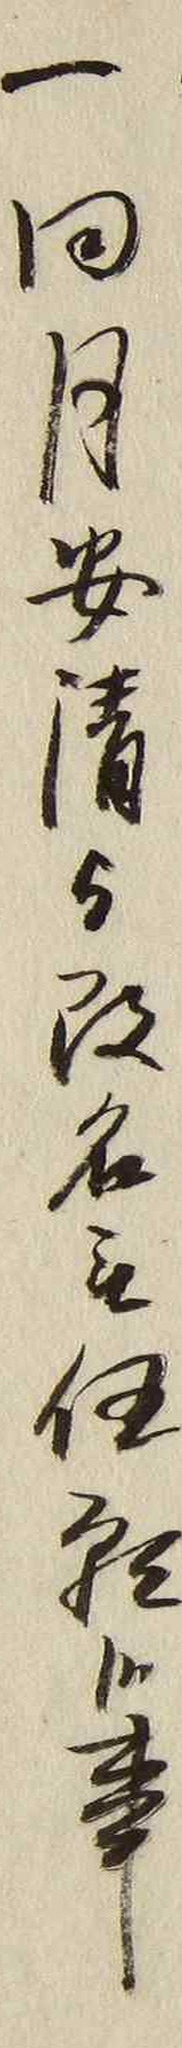一同月安清与改名被任願候事

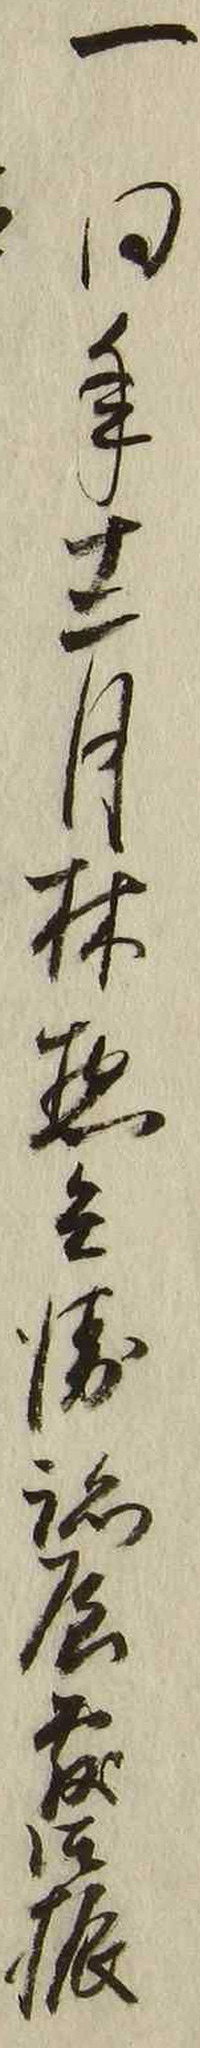一同年十二月林惣兵衛跡屋敷御振
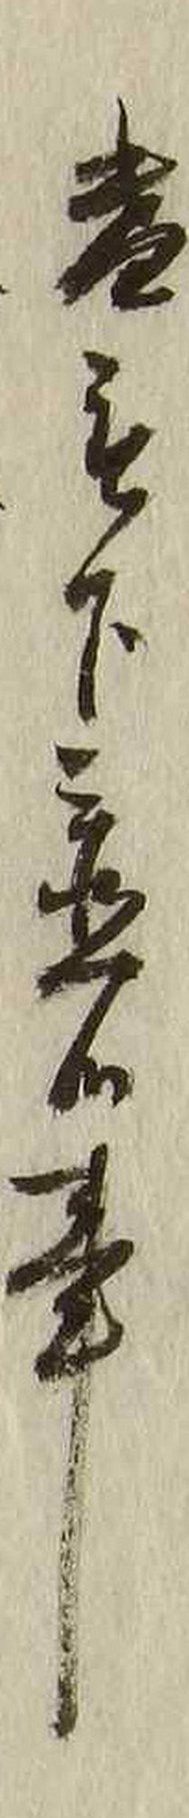替被下置候事
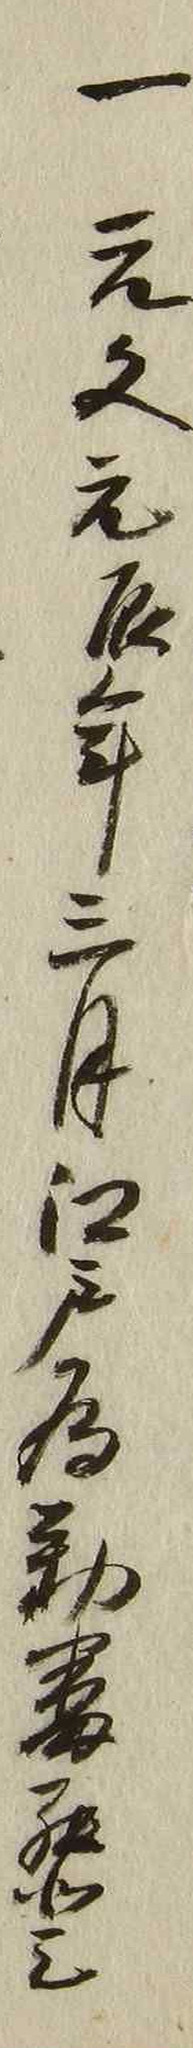一元文元辰年三月江戸為勤番罷登
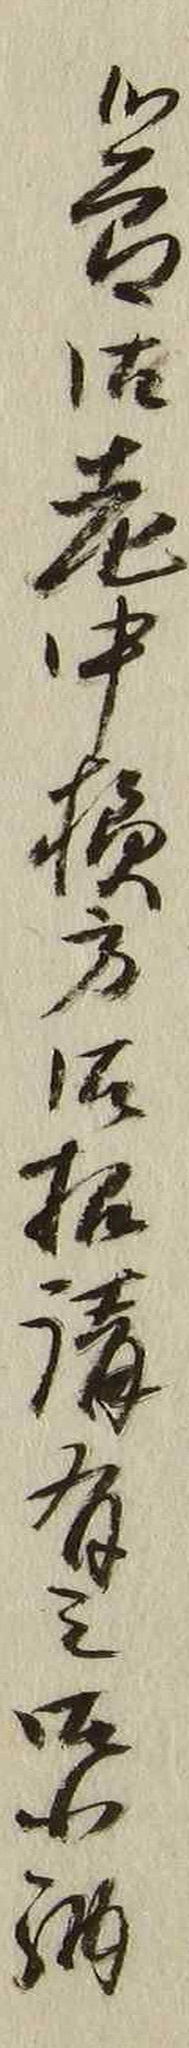候節御老中様方御招請有之御小納
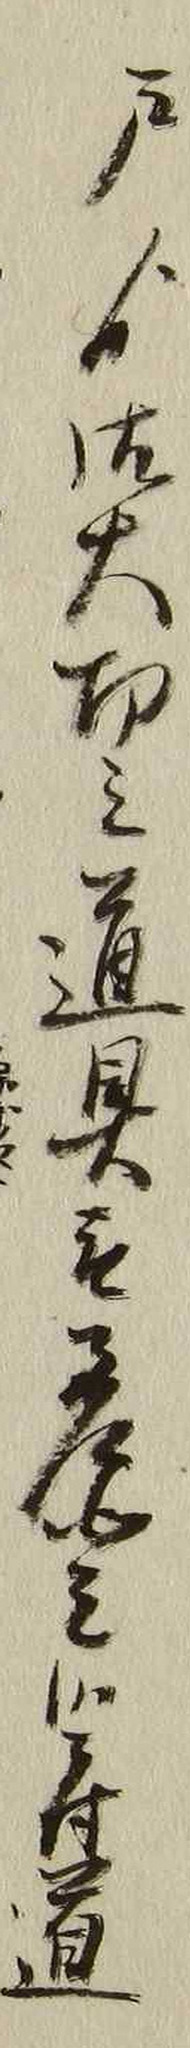戸ゟ御大切之道具被差登候ニ付道
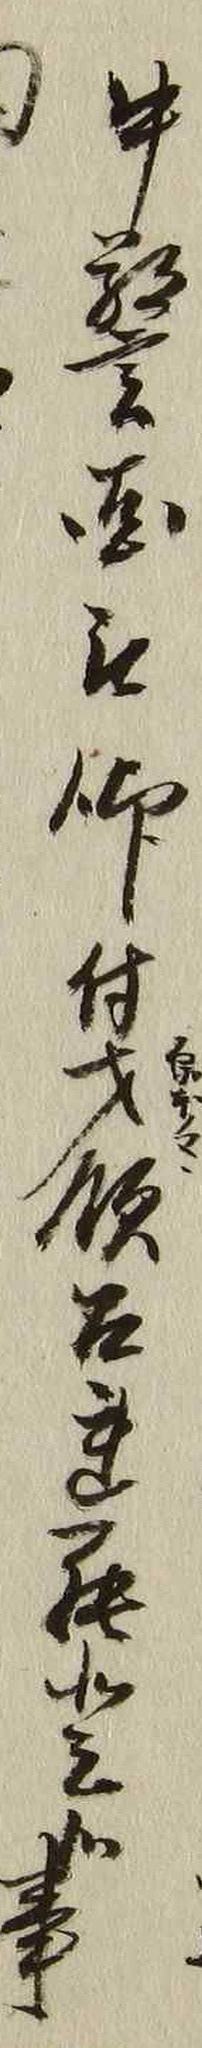中警固被仰付才領召連罷登候事
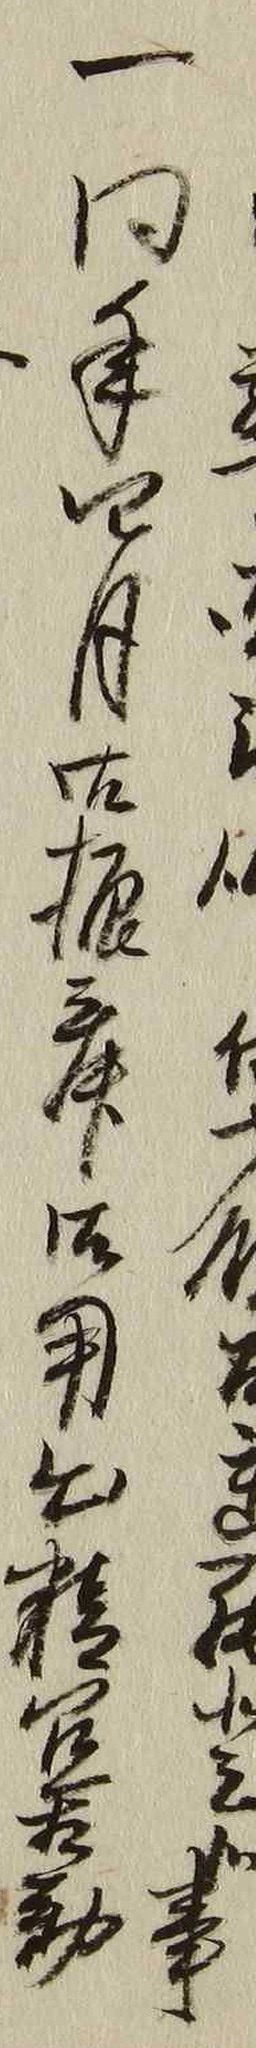一同年四月御振舞御用出精宜相勤
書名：諸士系譜　巻之349　も之部5
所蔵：会津若松市立会津図書館
